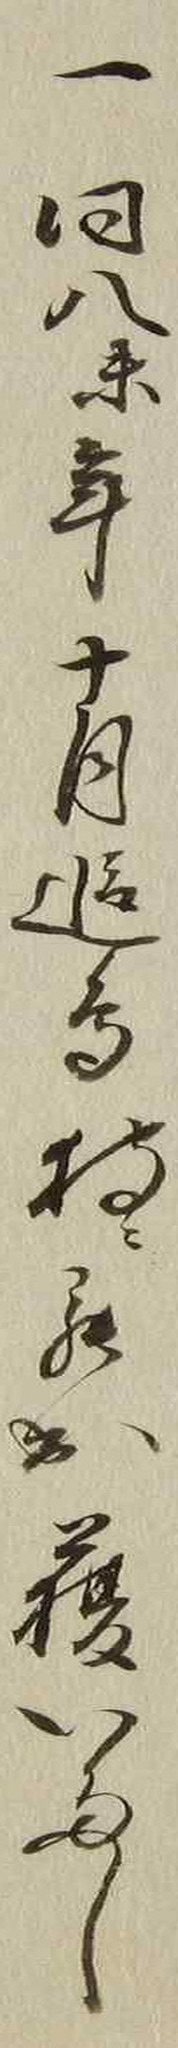一同八未年十月追鳥狩ニ罷出獲いたし
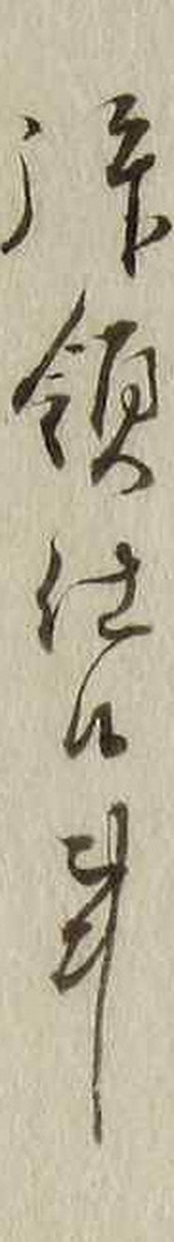拝領仕候事
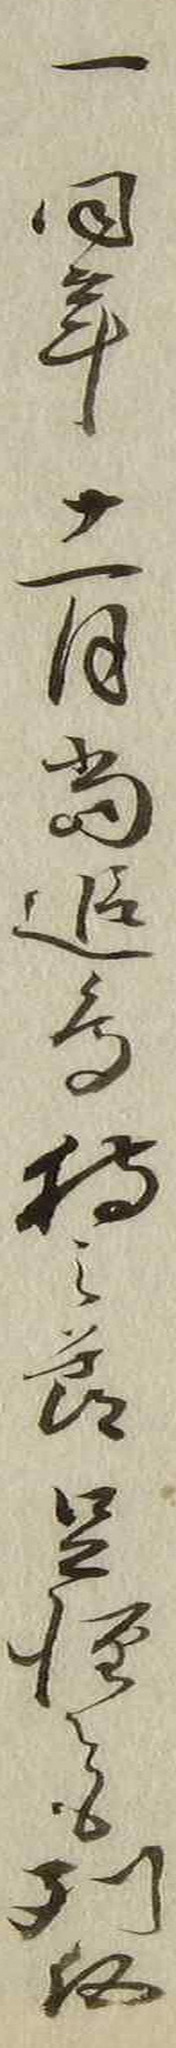一同年十一月当追鳥狩之節足経をも列伍
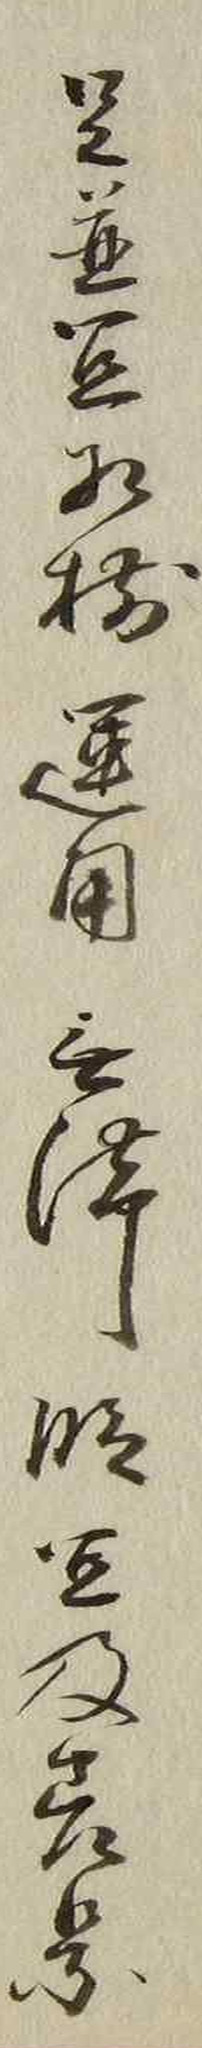足並宜相揃運用無滞段宜及差図
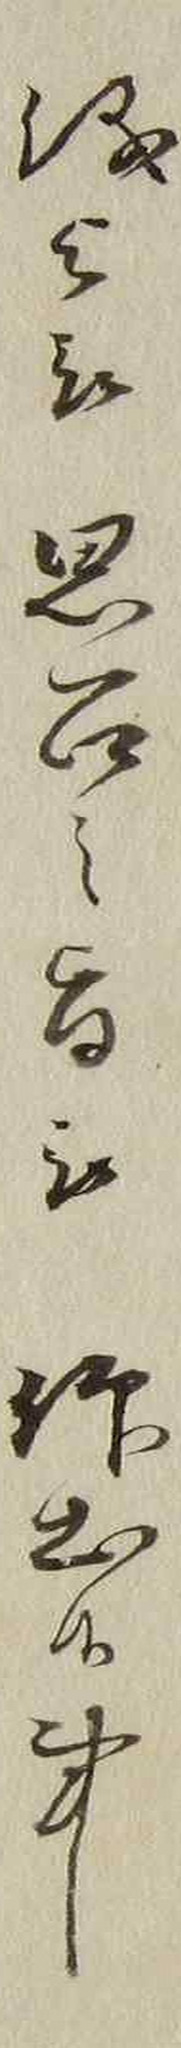儀与被思召之旨被仰出候事
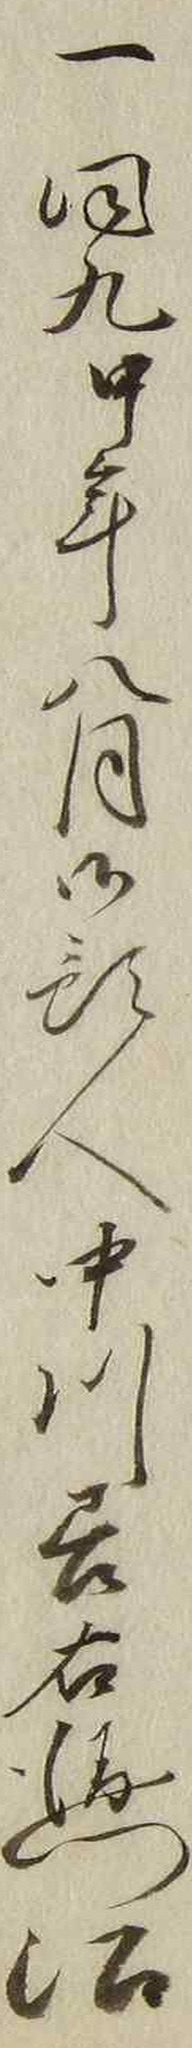一同九申年八月御預人中川善右衛門沼
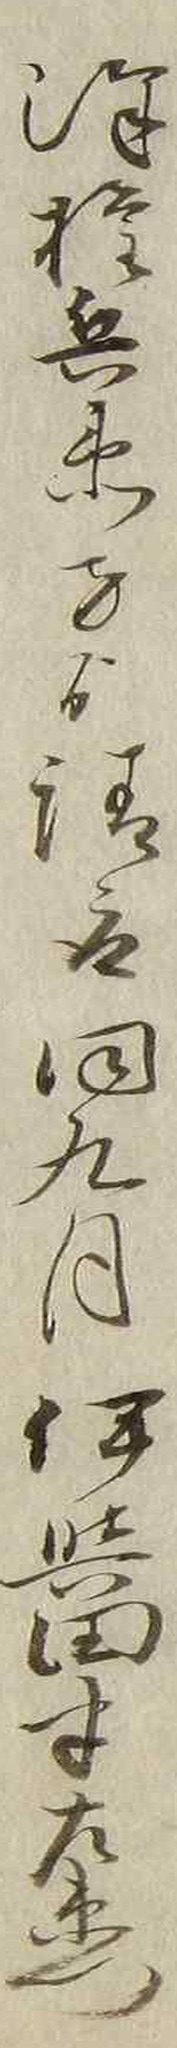沢権兵衛方ゟ請取同九月伊与田半左衛門
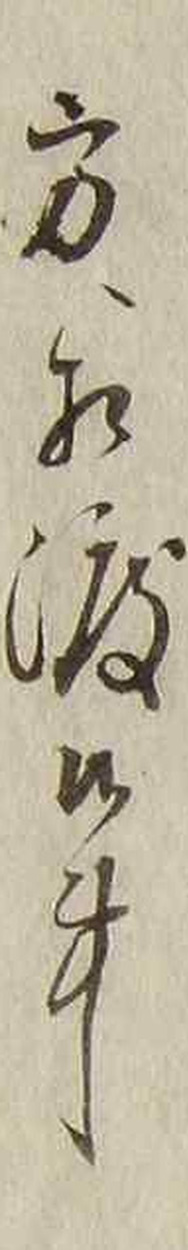方へ相渡候事

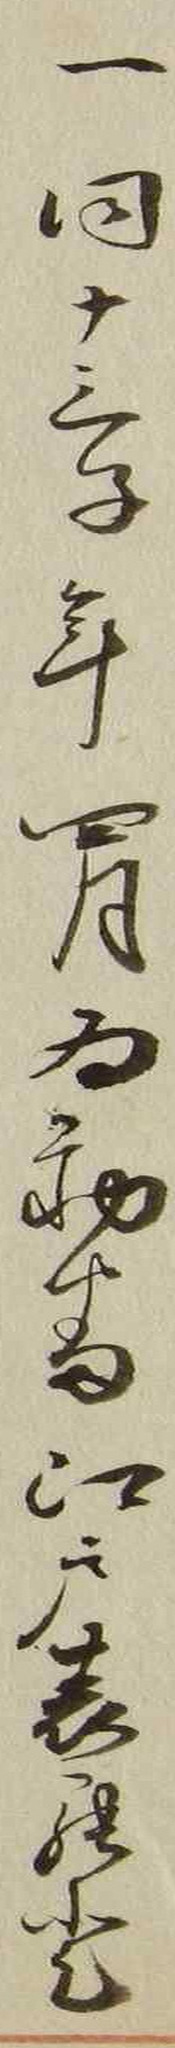一同十三子年四月為勤江戸表罷登
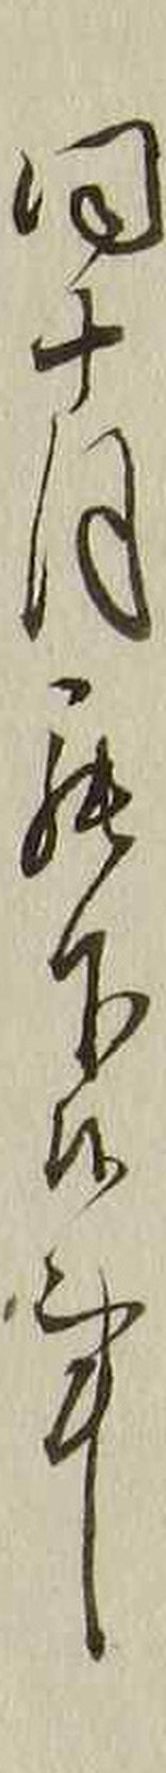同十月罷下候事
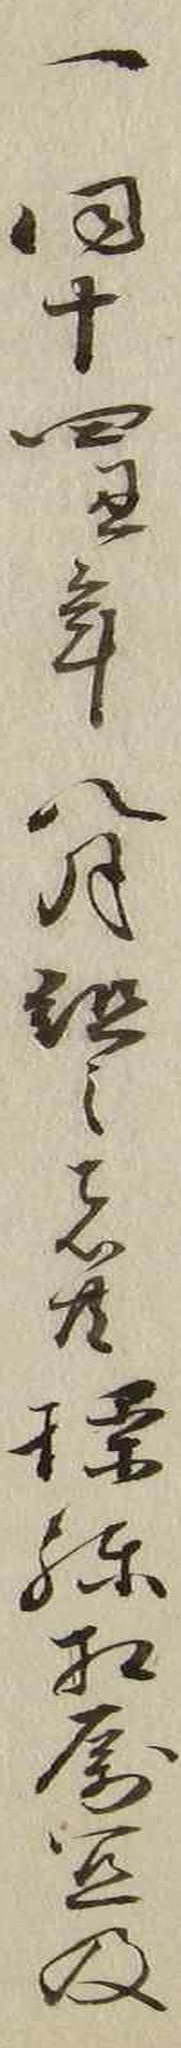一同十四丑年八月組之者共操練相属宜及
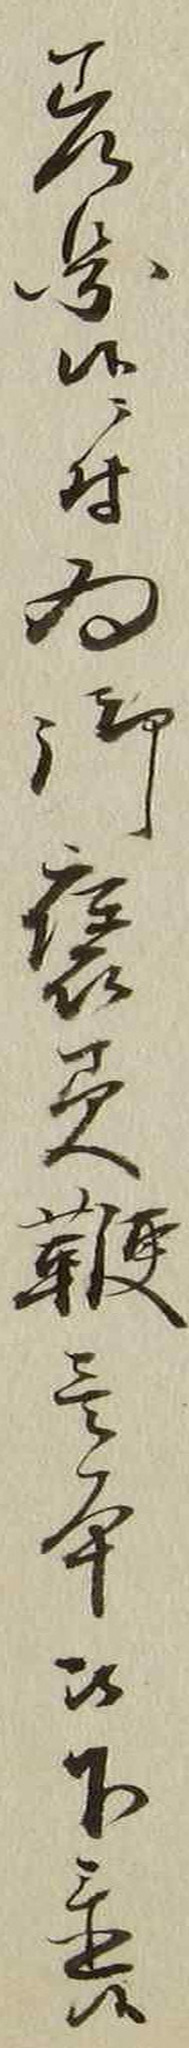差図候ニ付為御褒美鞭壱本被下置候
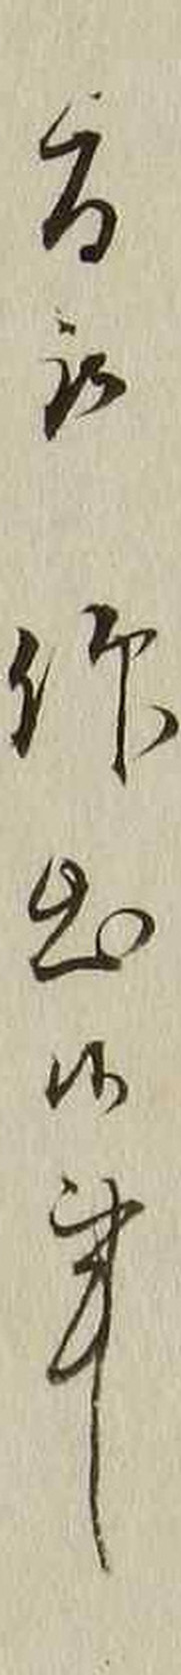旨被仰出候事
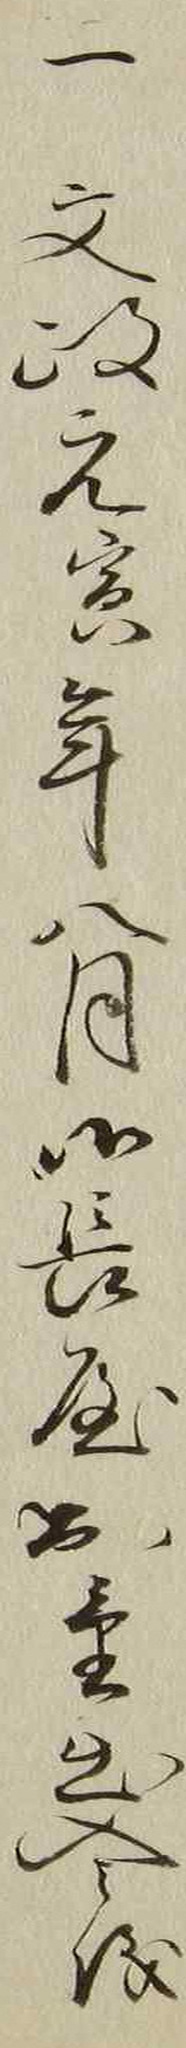一文政元寅年八月御長屋出金出入之儀
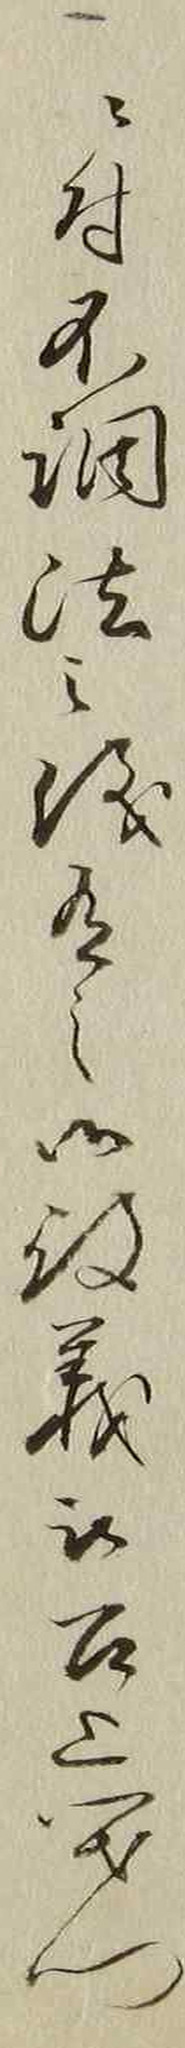ニ付不調法之儀有之御役義被召上閉門
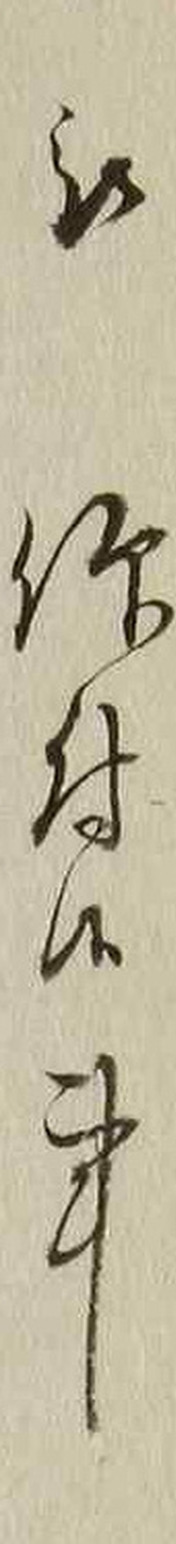被仰付候事
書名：諸士系譜　巻之122　よ之部5
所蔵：会津若松市立会津図書館
